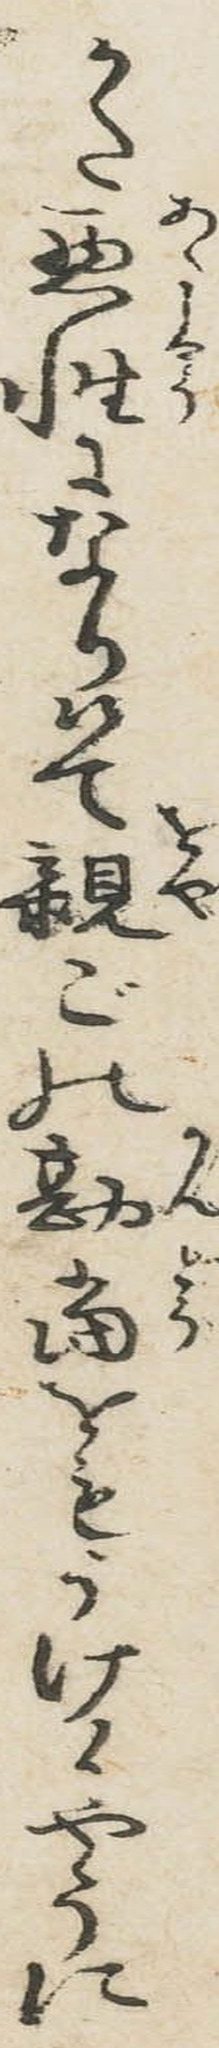かた悪性になり候て親ごの勘当をもうけ候やうに
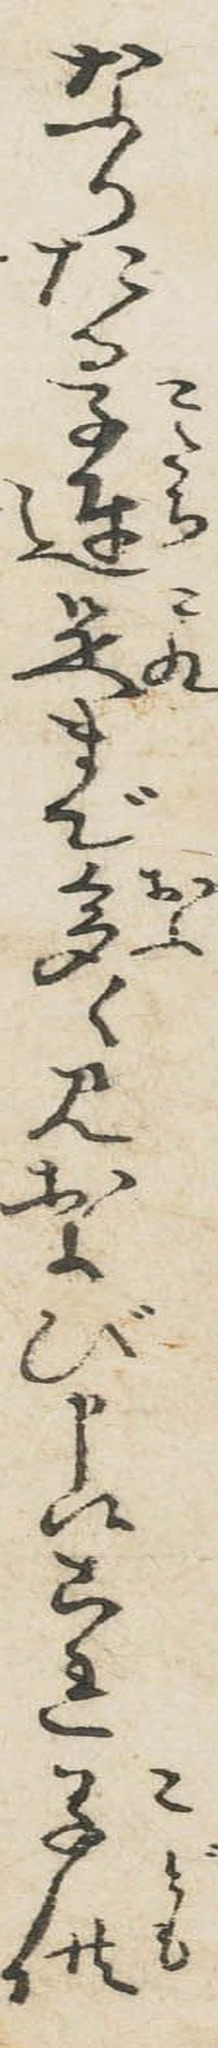なりたる子達是まで多く見および申候これ子供
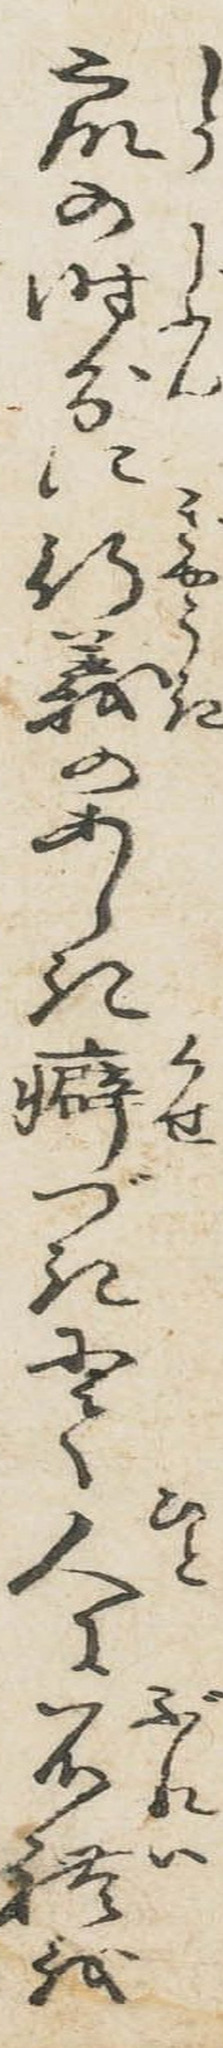衆の時分に行義のあしき癖づきにて人に不礼を
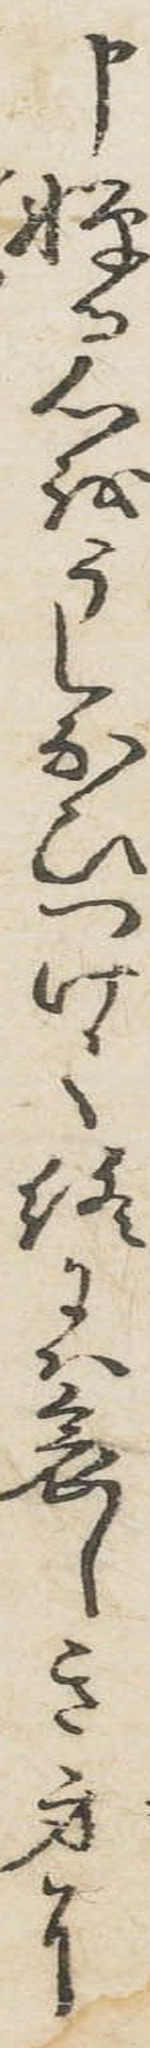申憚る心をうしなひつけて終には哀しき身に
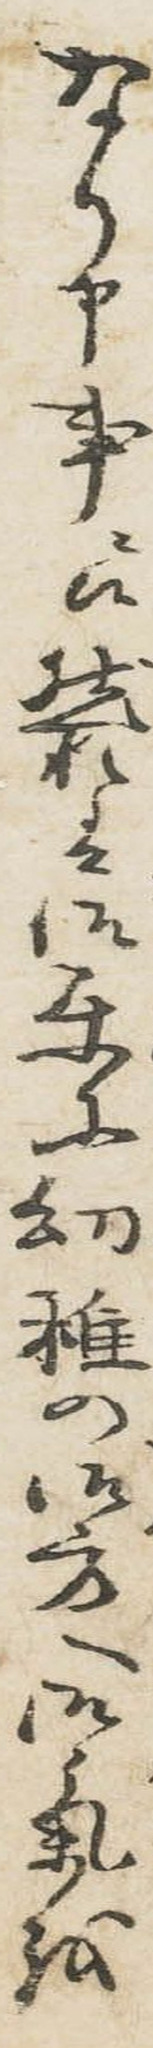なり申事に候然れは御互に幼稚の御方へ御気を
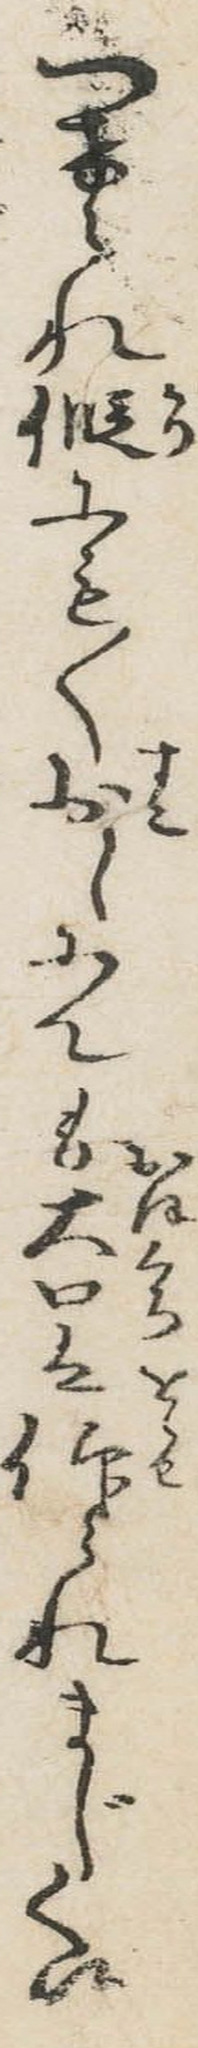つけられ假にも〳〵少しにても大口は仰られまじく候
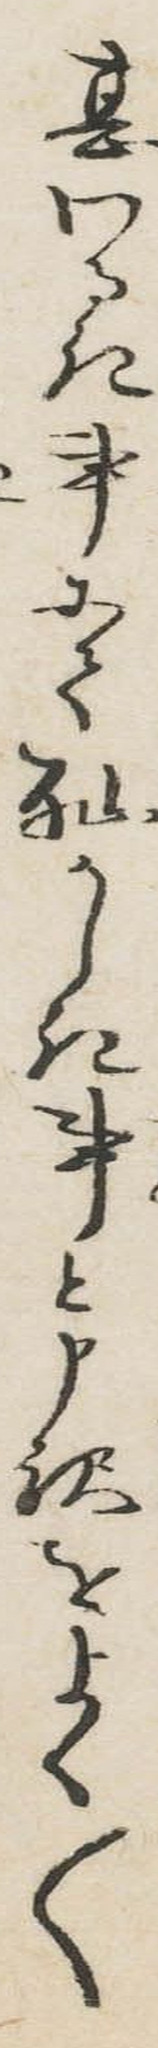甚わるき事にて恥かしき事と申訳をよく〳〵
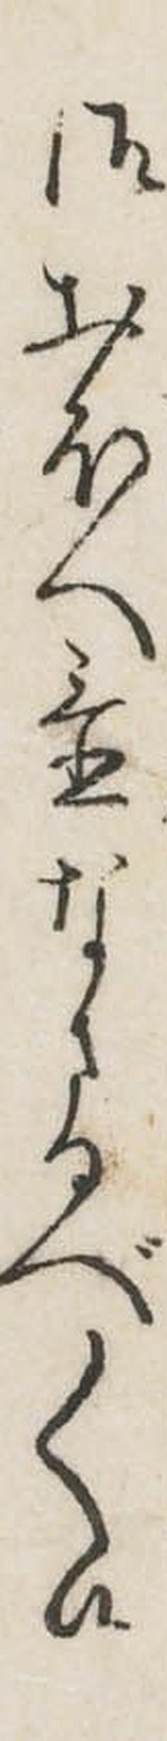御おほへ置なさるべく候
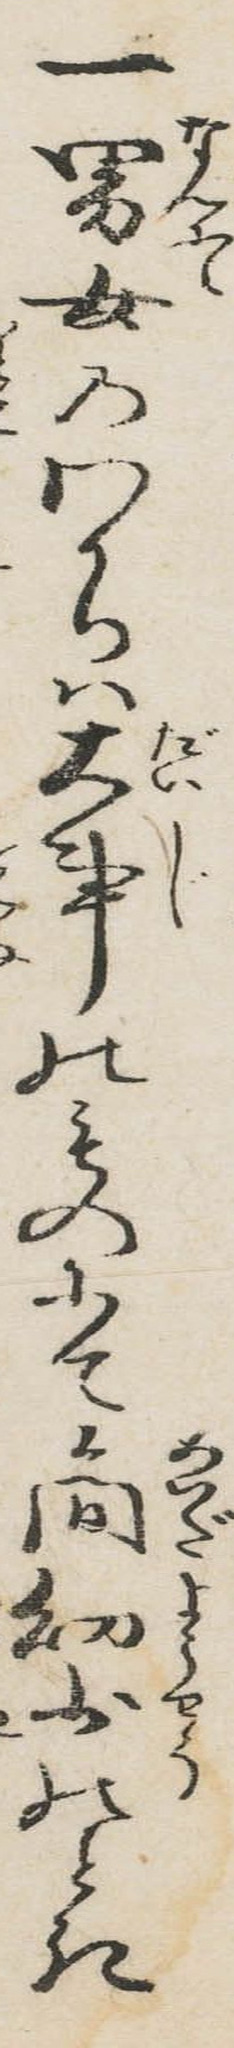一男女のわかりは大事のものにて候間幼少のとき
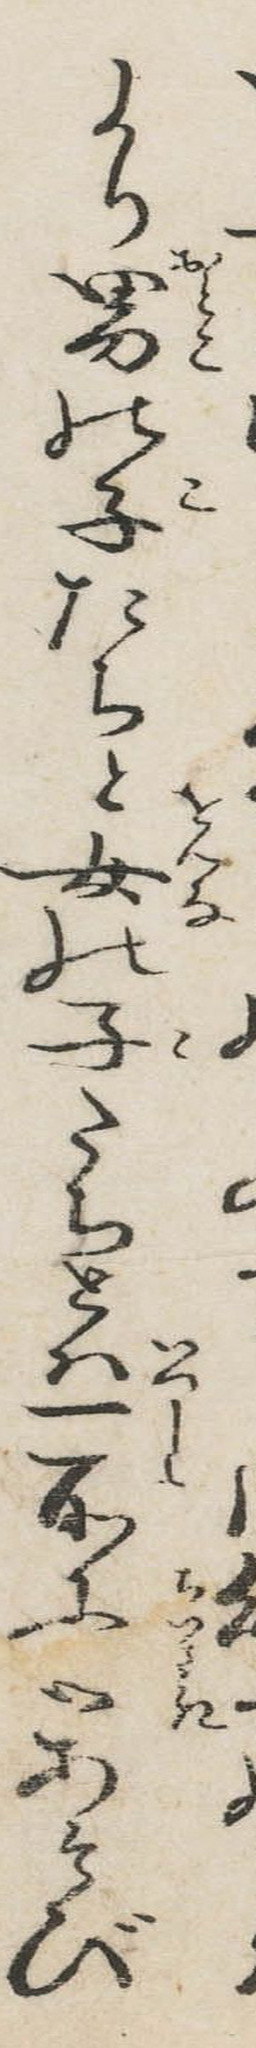より男の子たちと女の子たちとは一所に御あそび
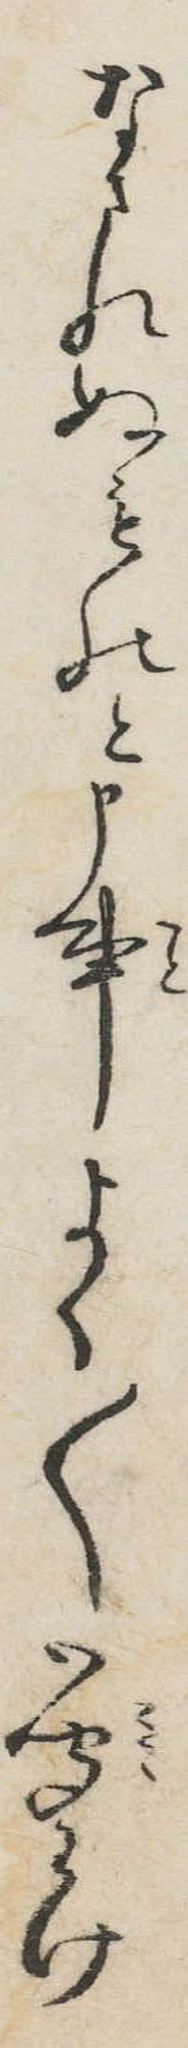なされぬものと申事よく〳〵御聞わけ
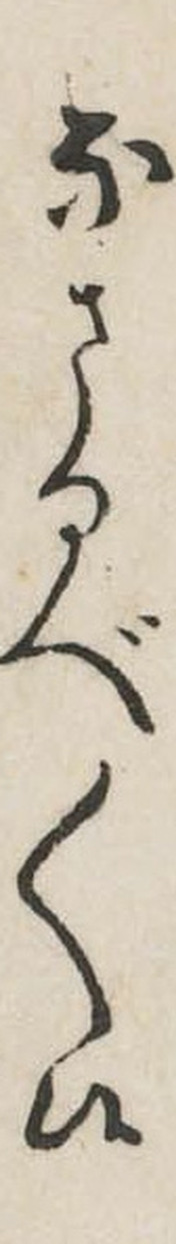なさるべく候
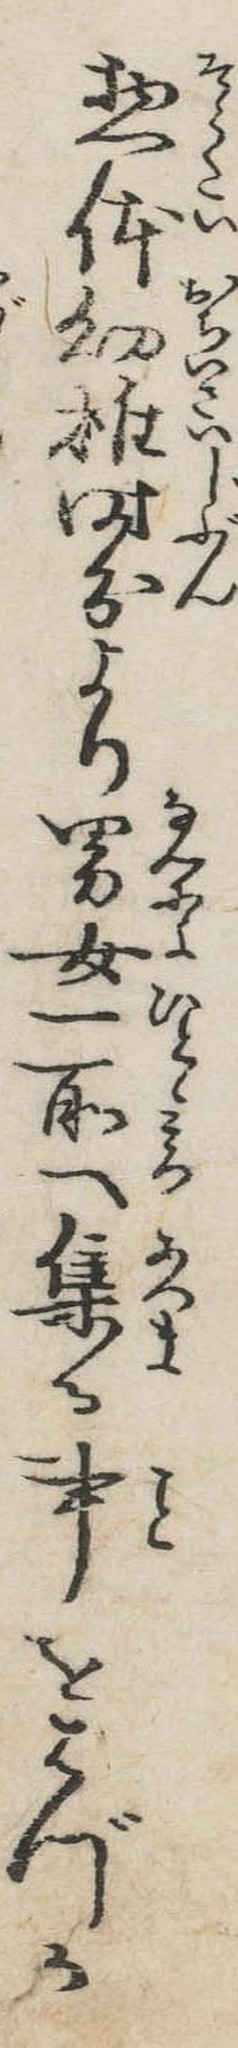惣体幼稚時分より男女一所へ集る事をはづか
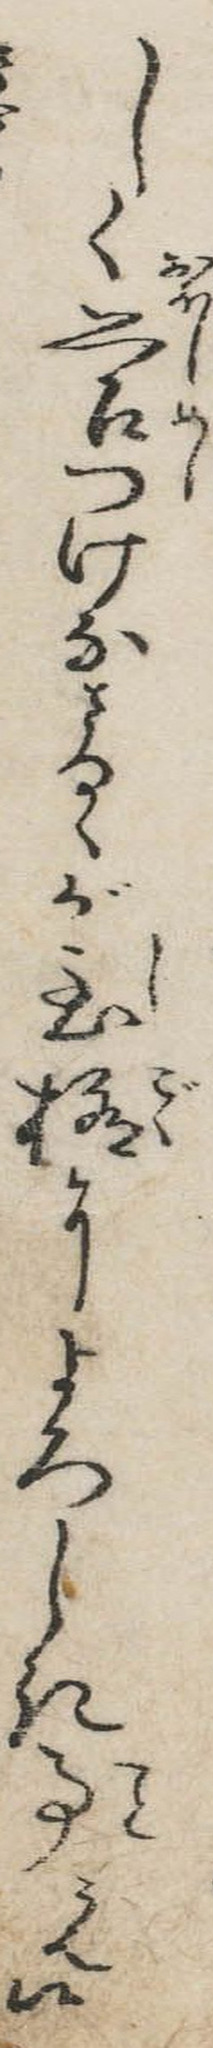しく思召つけなさるゝが至極によろしき事にて候
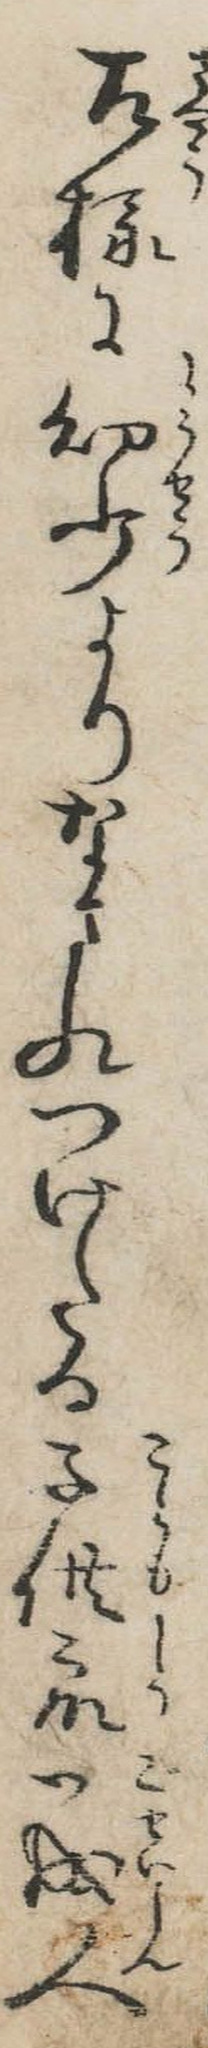左様に幼少よりなされつけたる子供衆御成人

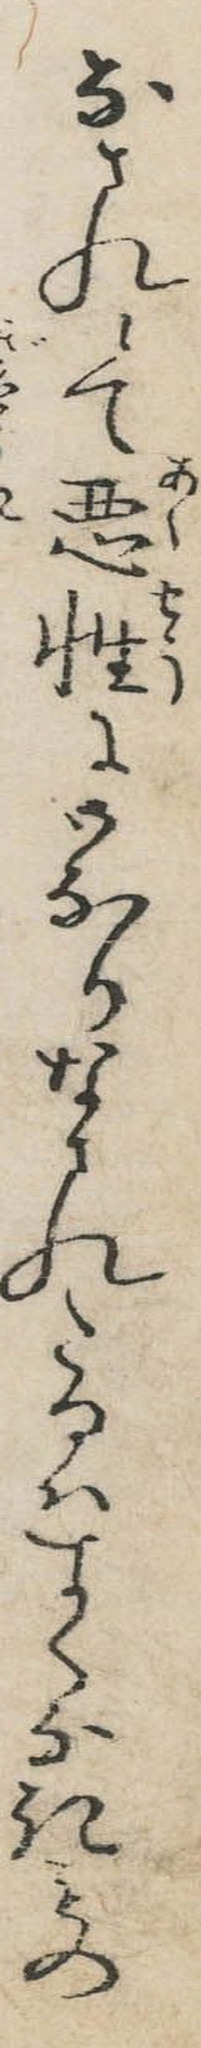なされ候て悪性に御なりなされたるはすくなきもの
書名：前訓
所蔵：東京学芸大学附属図書館
